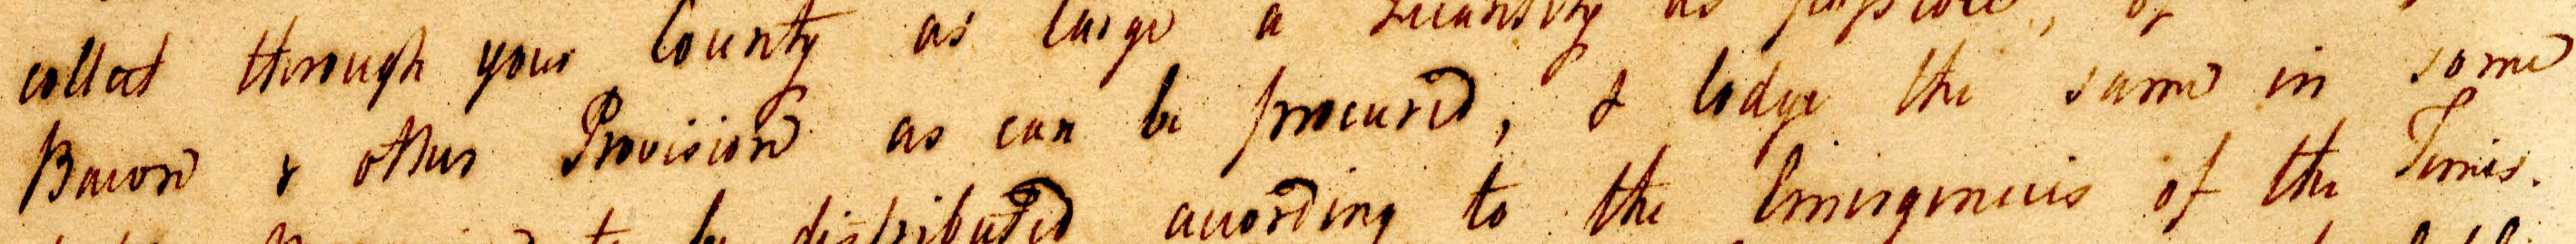Bacon & other Provision as can be procured, & lodge the same in some
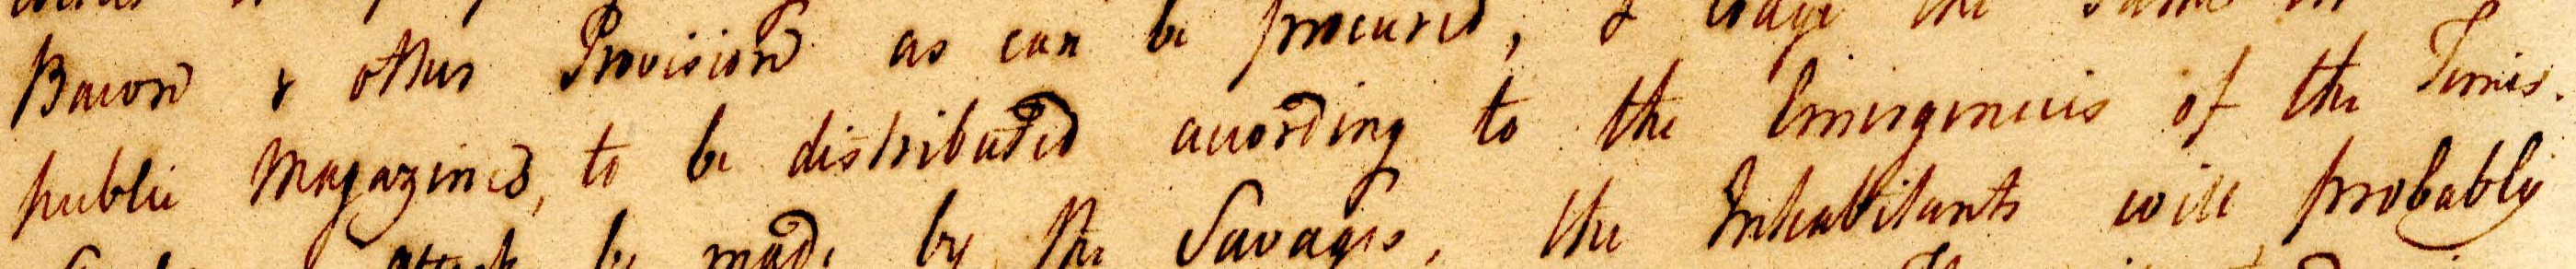public Magazines, to be distributed according to the Emergencies of the Times.
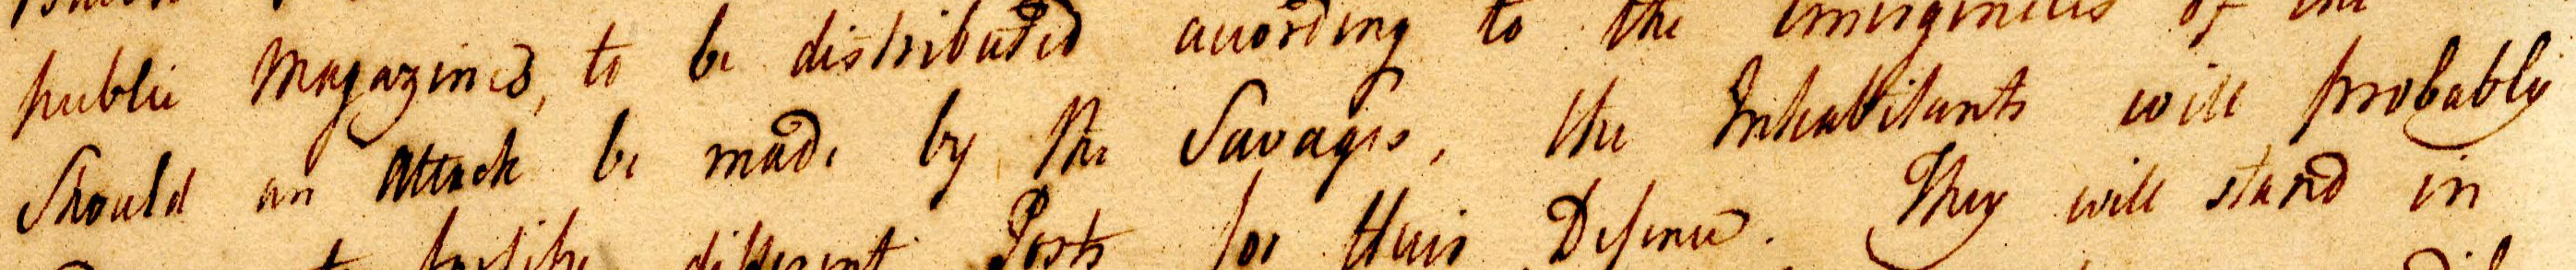Should an attack be made by the Savages, the Inhabitants will probably
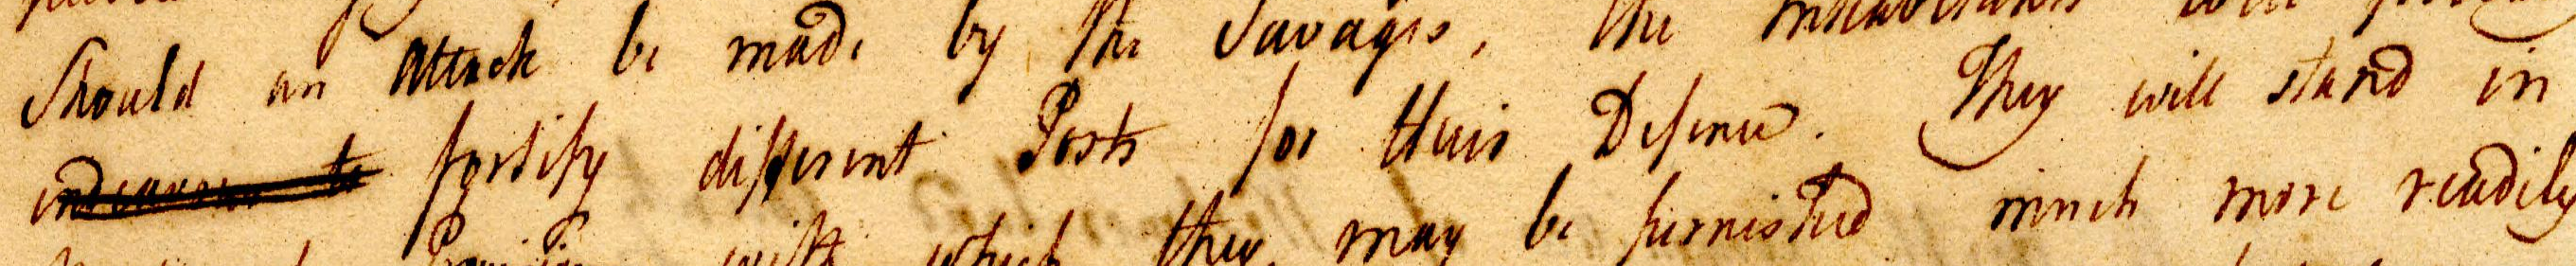[indeavour to] fortify different Posts for their Defence. They will stand in
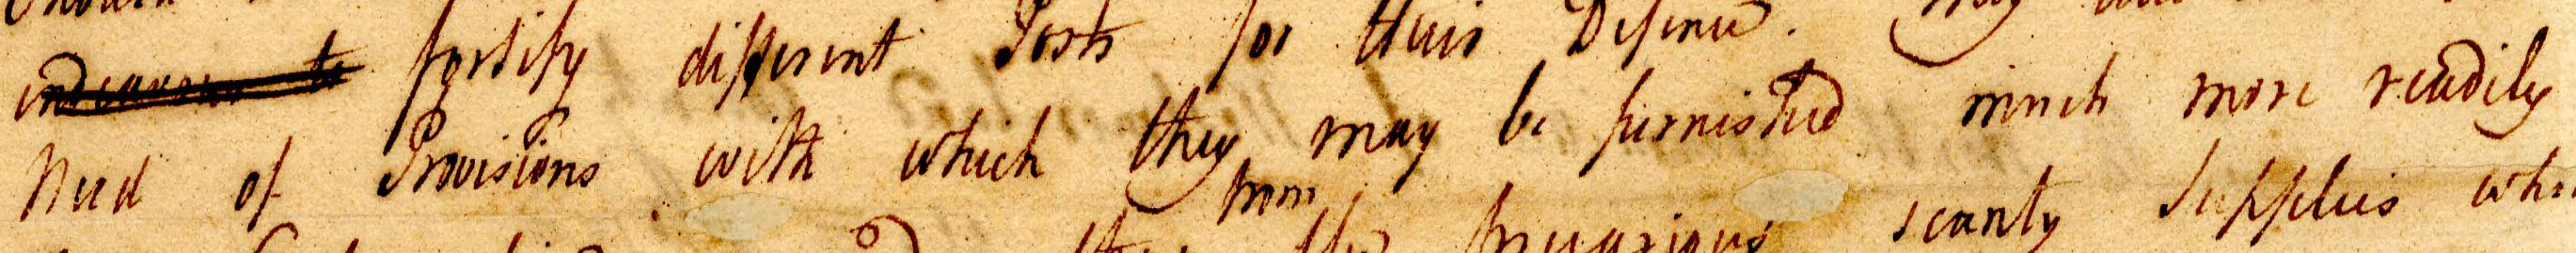Need of Provisions with which they may be furnished much more readily
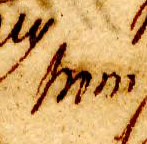from
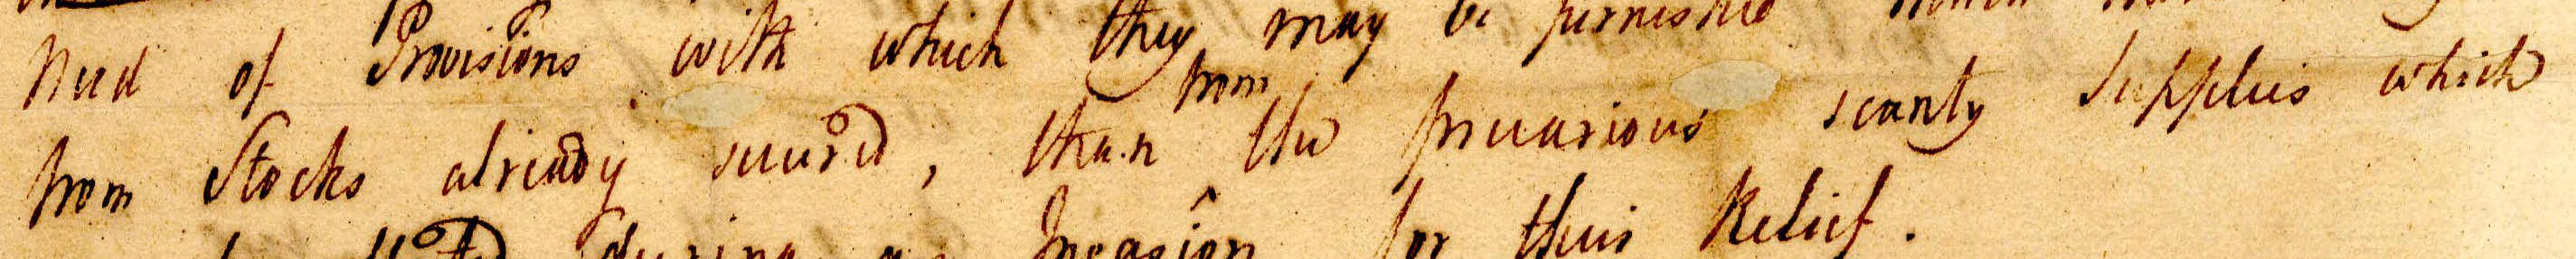from Stocks already secured, than ^ the precarious scanty Supplies which
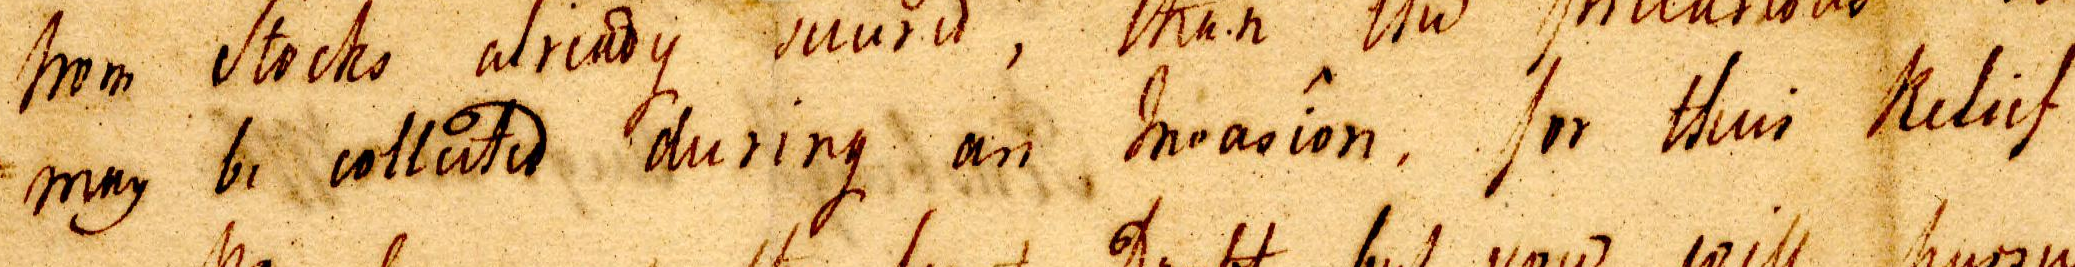may be collected during an Invasion for this Relief.
